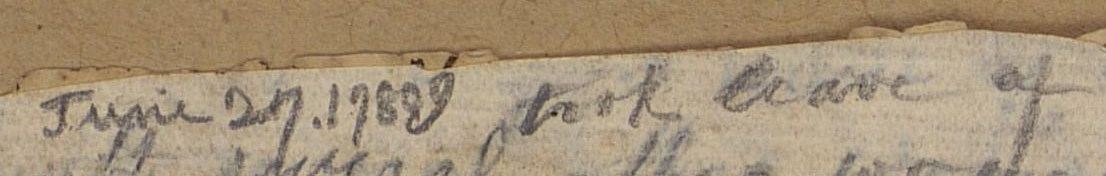June 27 1789 took leave of
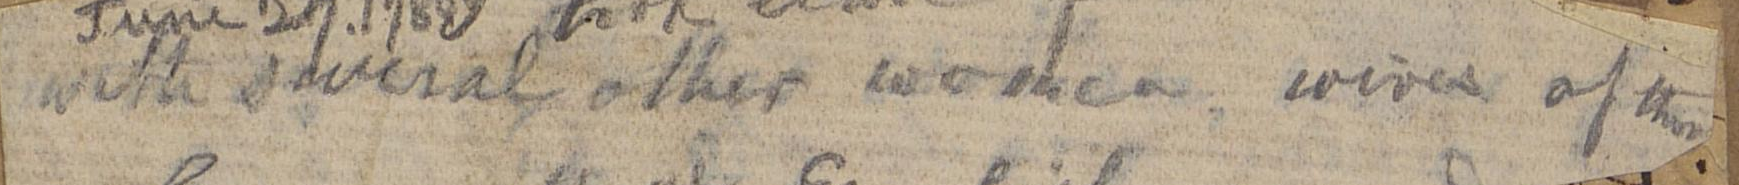with several other women wives of thor
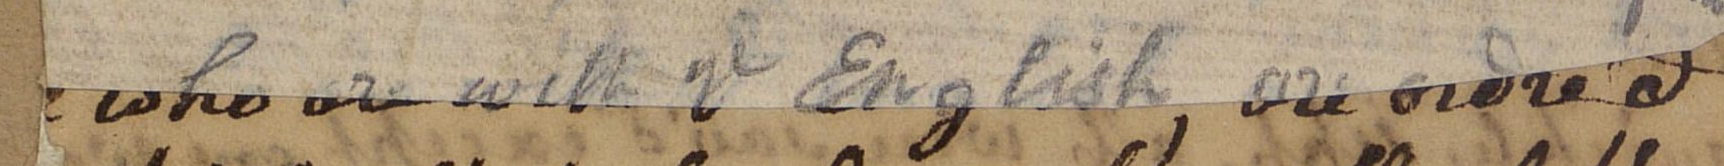who are with y^e English, are ordre'd
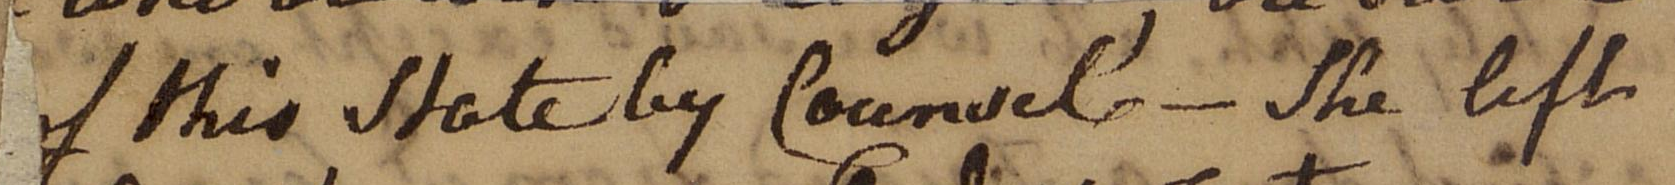of this State by Counsel- She left
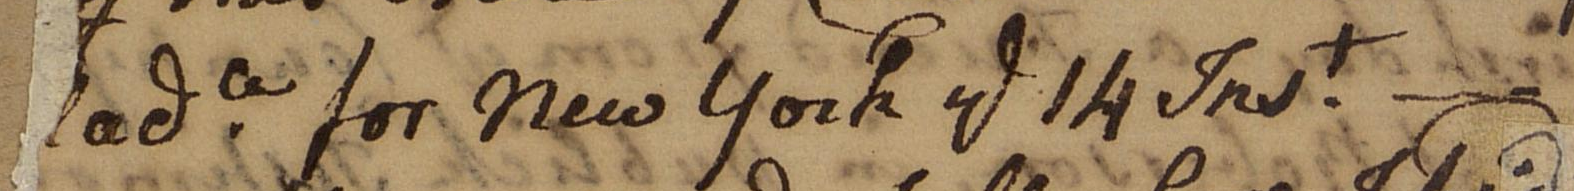lad.^a for New York y^e 14 Ins^t.-
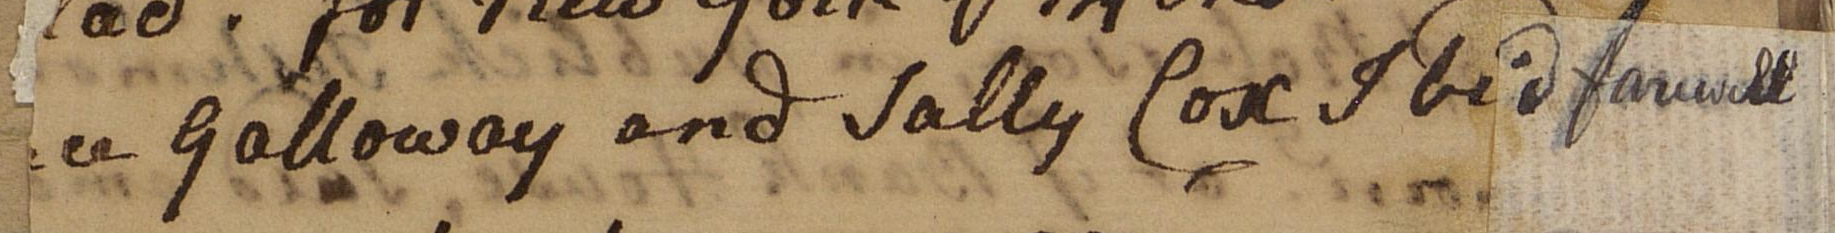ce Galloway and Sally Cox I bid farewell
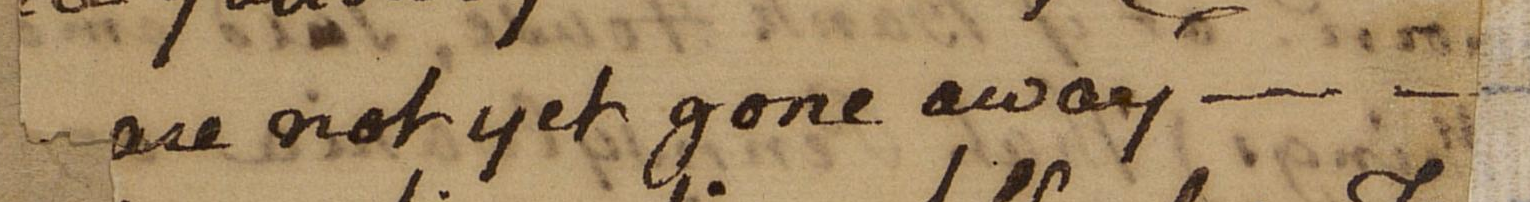are net yet gone away--
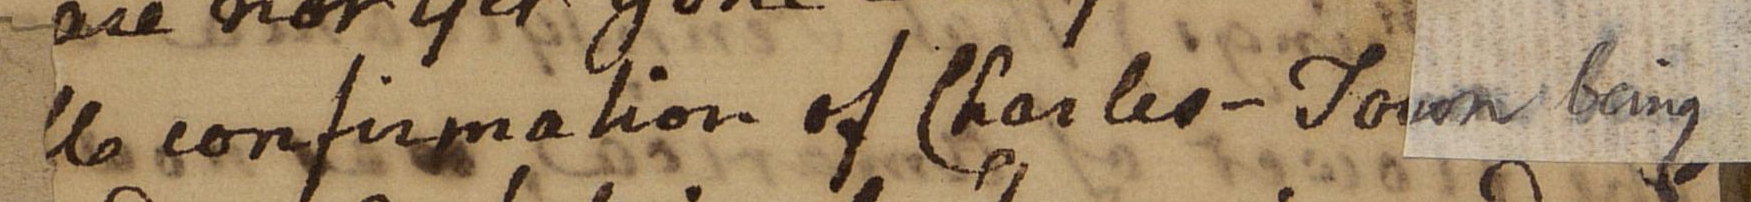ll confirmation of Charles-Town being
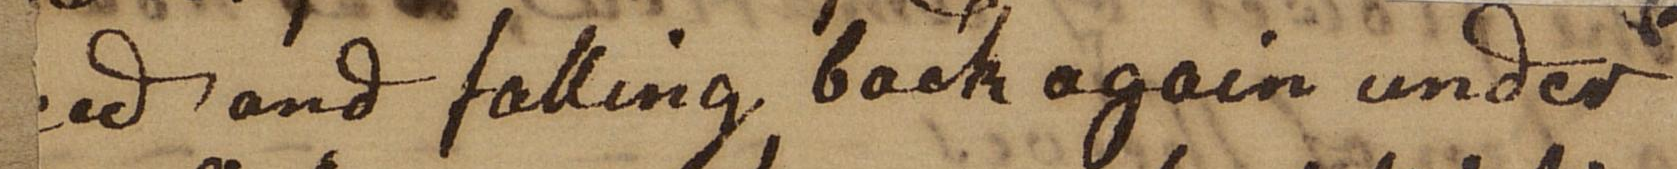ced and falling back again under
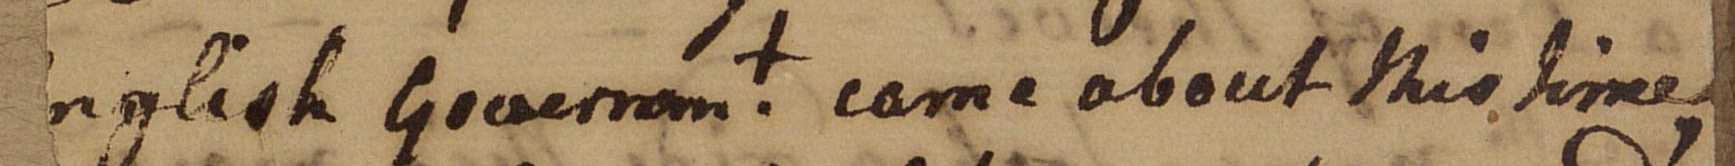nglish Govermen^t. came about this time
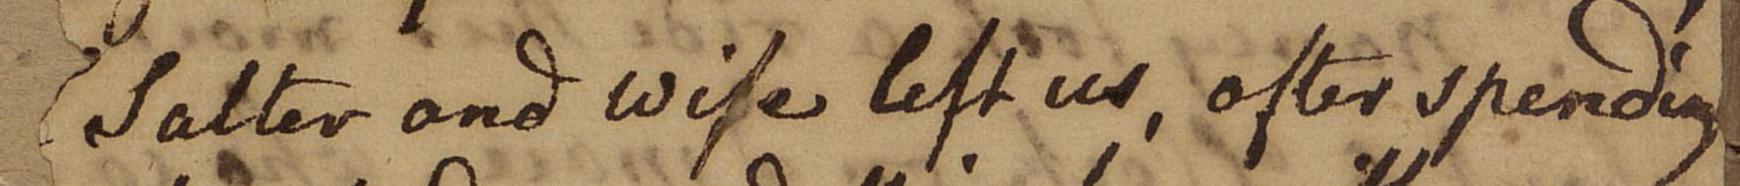Salter and Wife left us, after spending
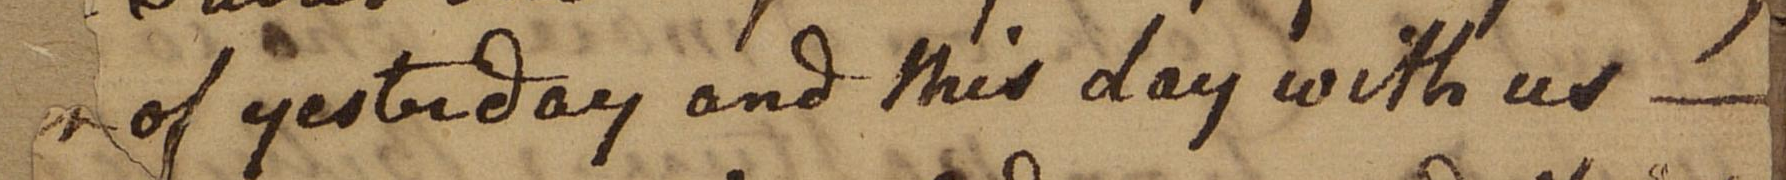of yesterday and this day with us-
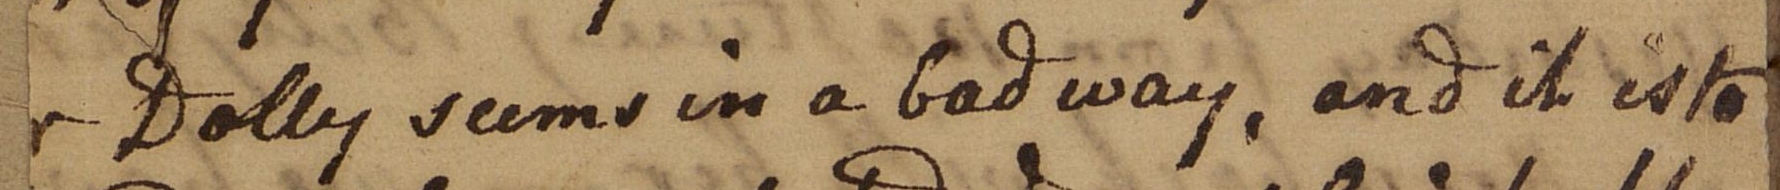-Dolly seems in a bad way, and it is to
